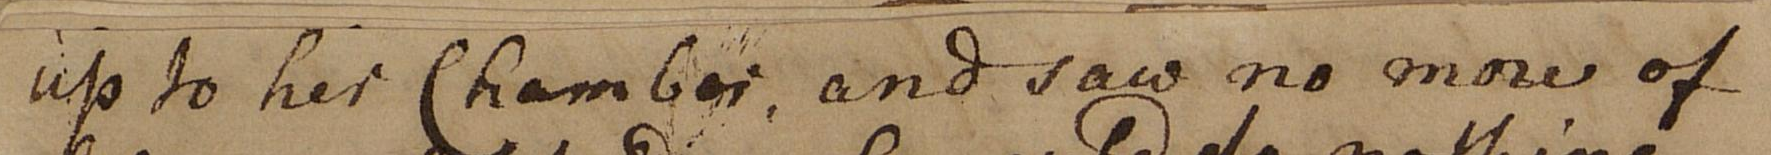up to her Chamber, and saw no more of
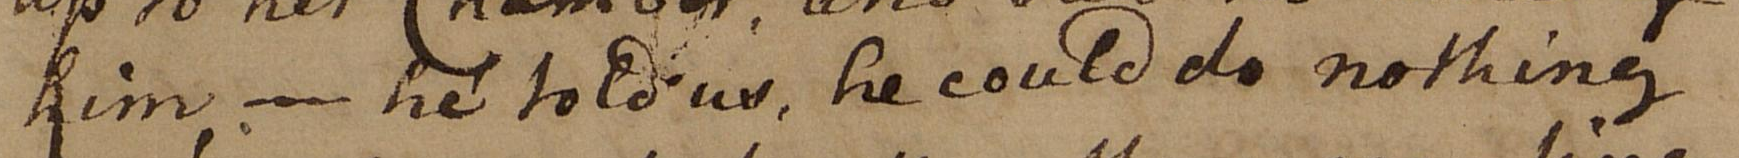him,- he told us, he could do nothing
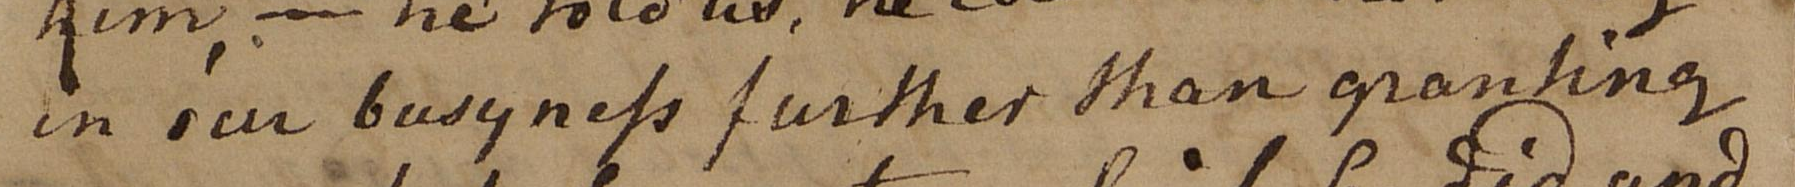in our busyness further than granting
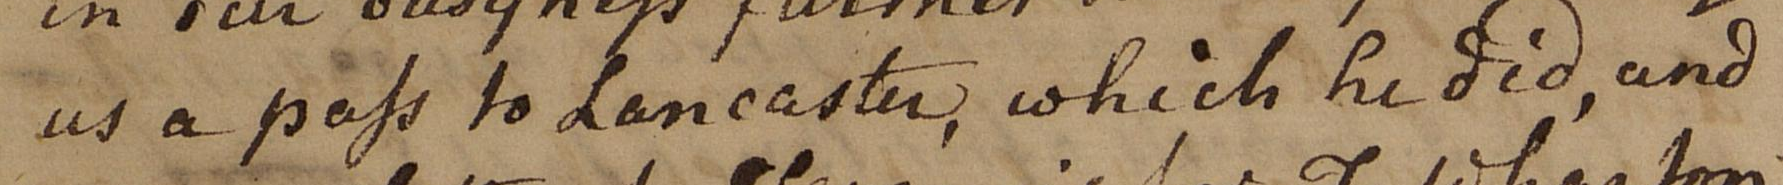us a pass to Lancaster, which he did, and
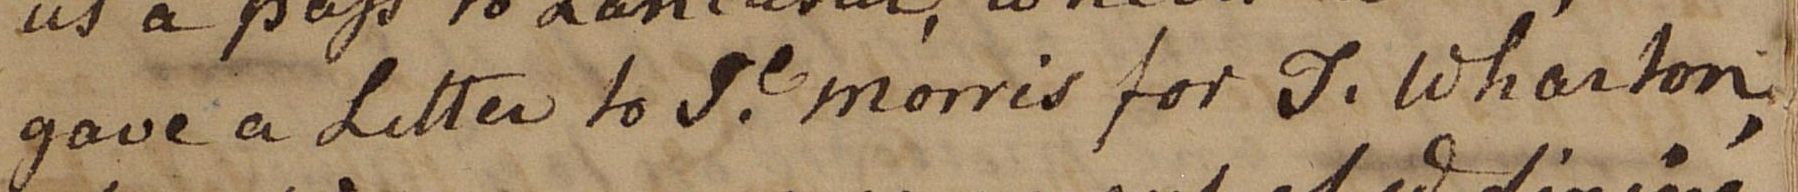gave a Letter to J^c. Morris for T. Wharton,
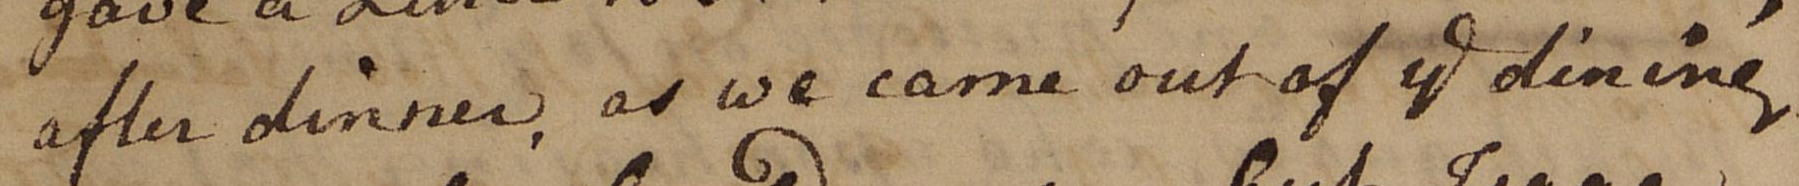after dinner, as we came out of y^e dining
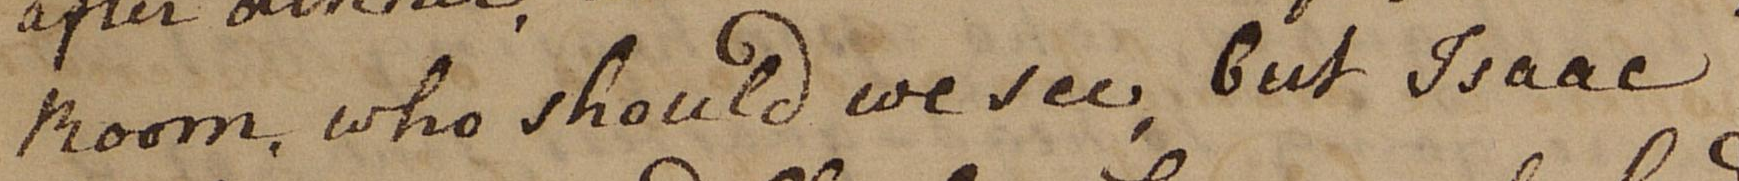Room, who should we see, but Isaac
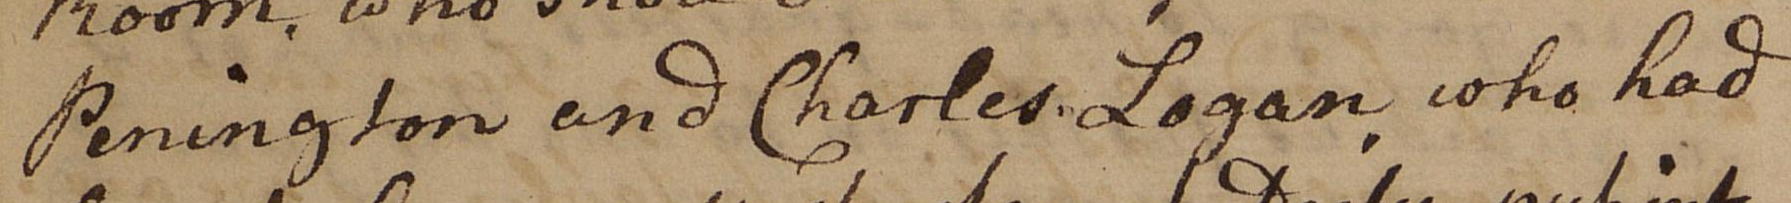Penington and Charles Logan, who had
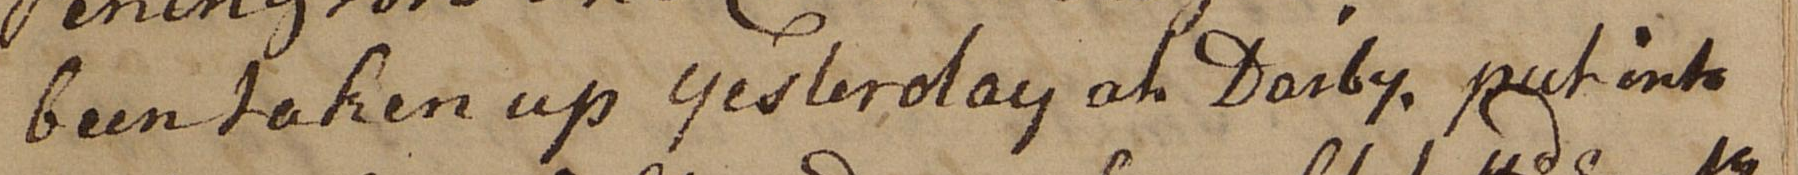been taken up yesterday at Darby, put into
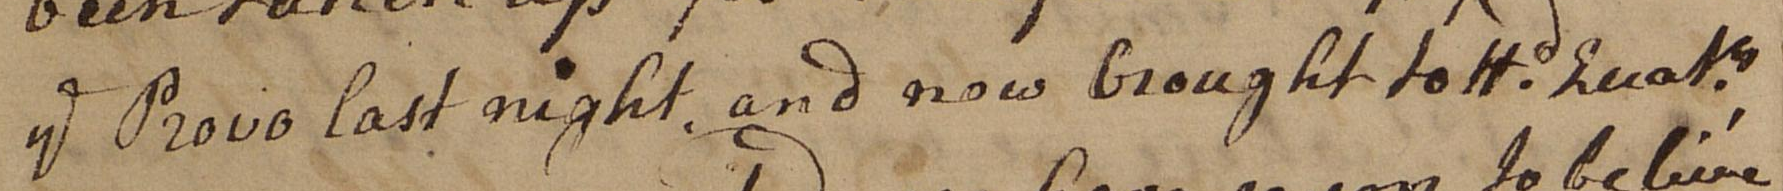y^e Provo last night, and now brought to H^d. Quat^rs.
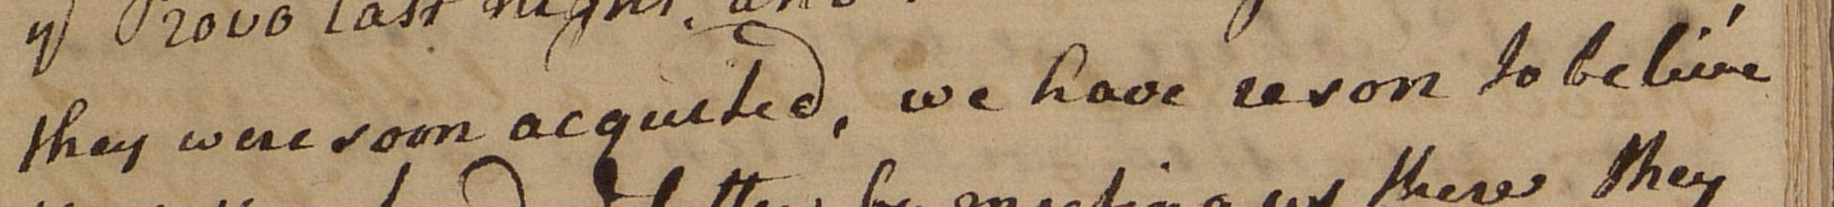they were soon acquited, we have reson to believe,
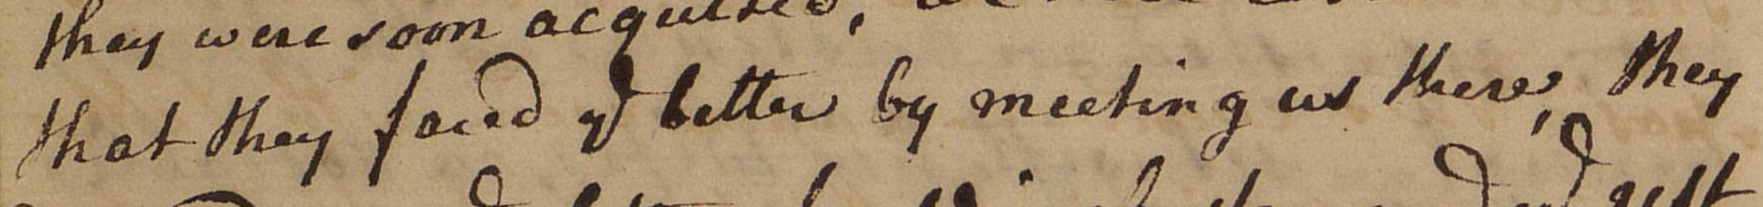that they faced y^e better by meeting us there, they
